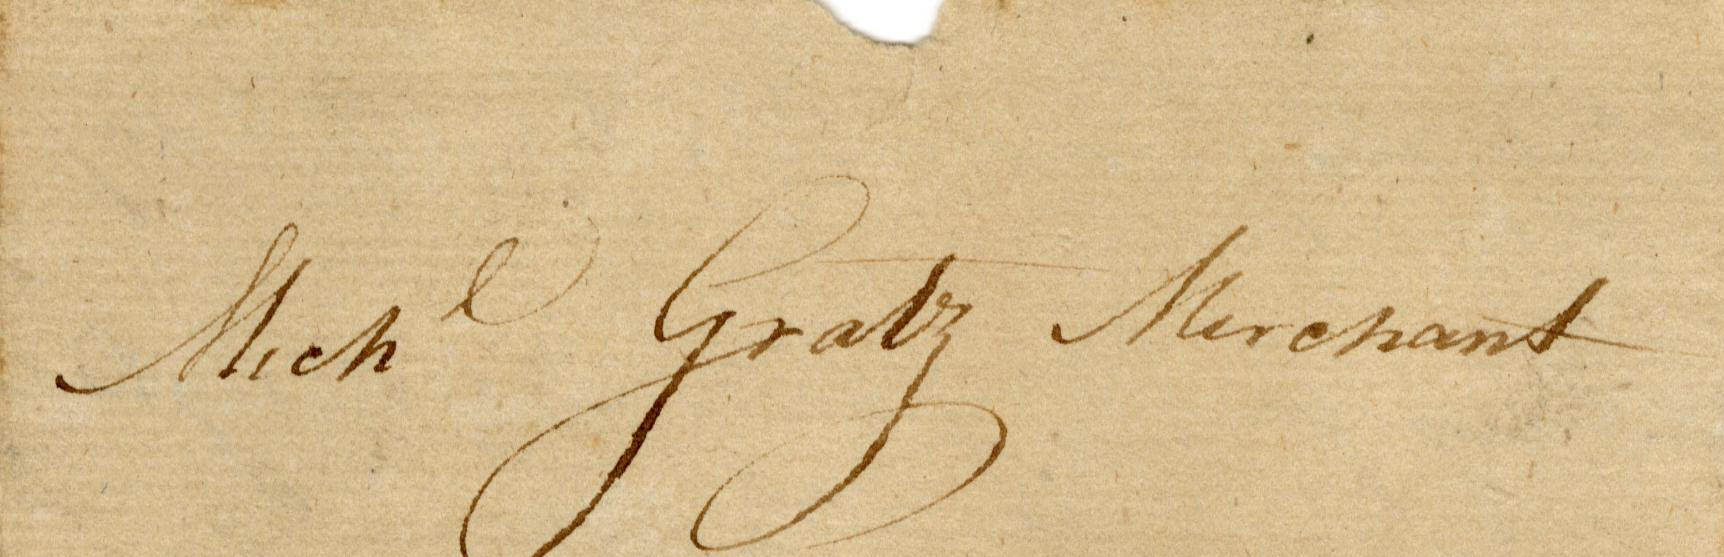Mich^l Gratz Merchant
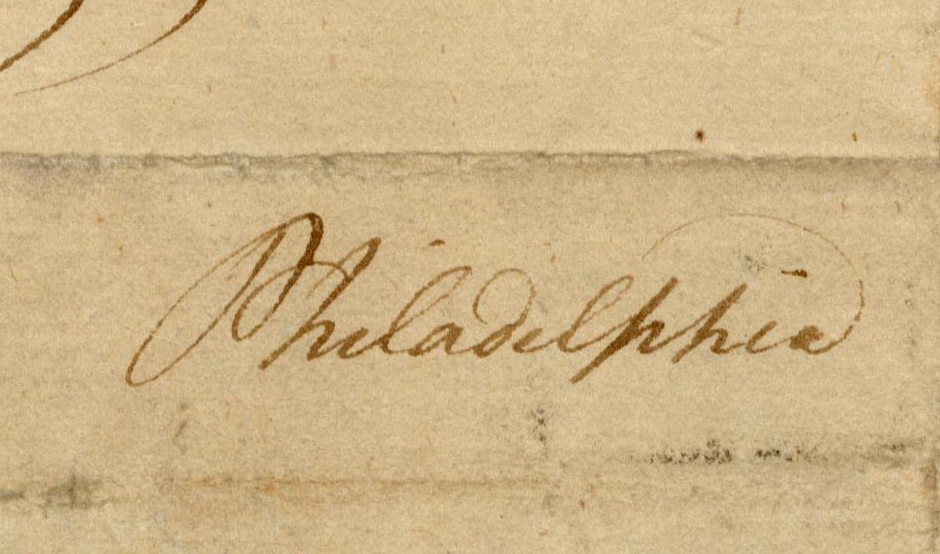Philadelphia
